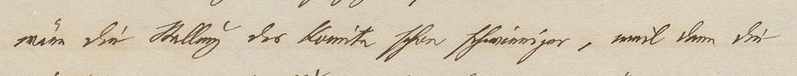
wäre die Stellung des Komite schon schwieriger, weil dann die
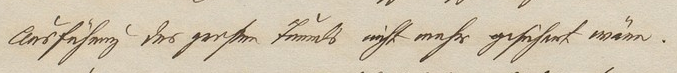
Ausführung des großen Tunnels nicht mehr gesichert wäre.
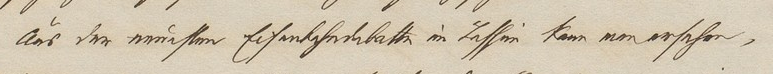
Aus der neuesten Eisenbahndebatte im Tessin kann man ersehen,
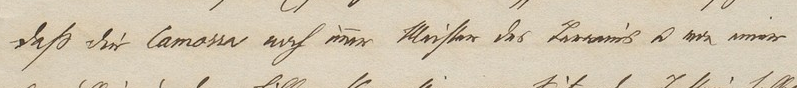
daß die Camorra noch immer Meister des Terrain's u von einer
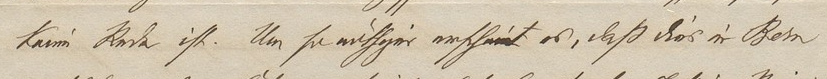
keine Rede ist. Um so wichtiger erscheint es, daß dies in Bern
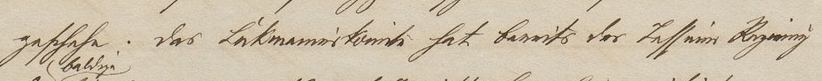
geschehe. Das Lukmanierkomite hat bereits der Tessiner Regierung
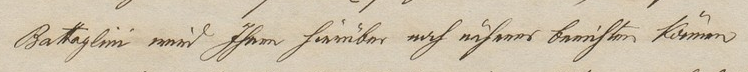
Battaglini wird Ihnen hierüber noch näheres berichten können.
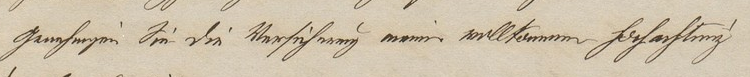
Genehmigen Sie die Versicherung meiner vollkommenen Hochachtung
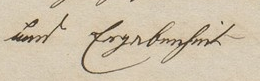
und Ergebenheit
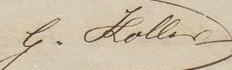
G. Koller
